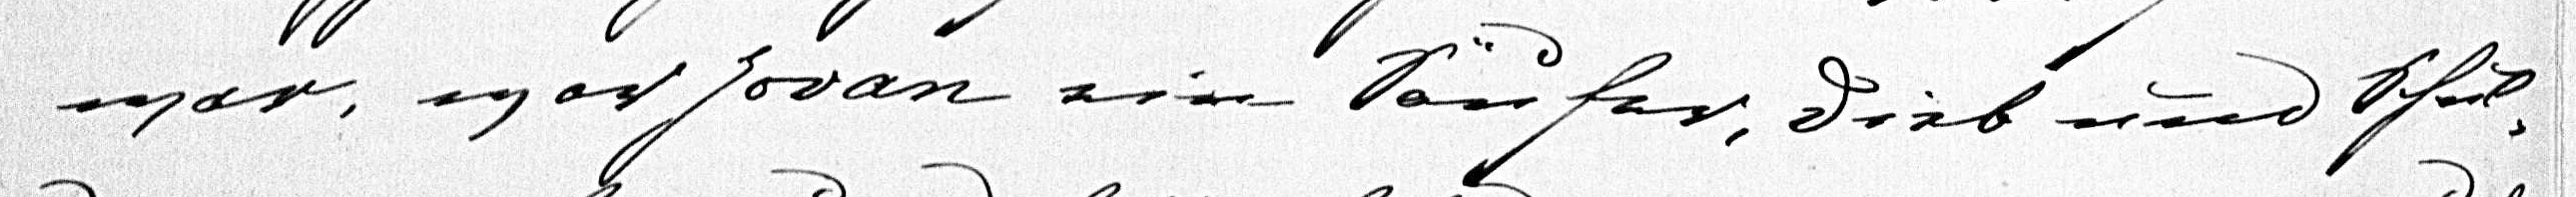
war, war Jovan ein Säufer, Dieb und Schul¬
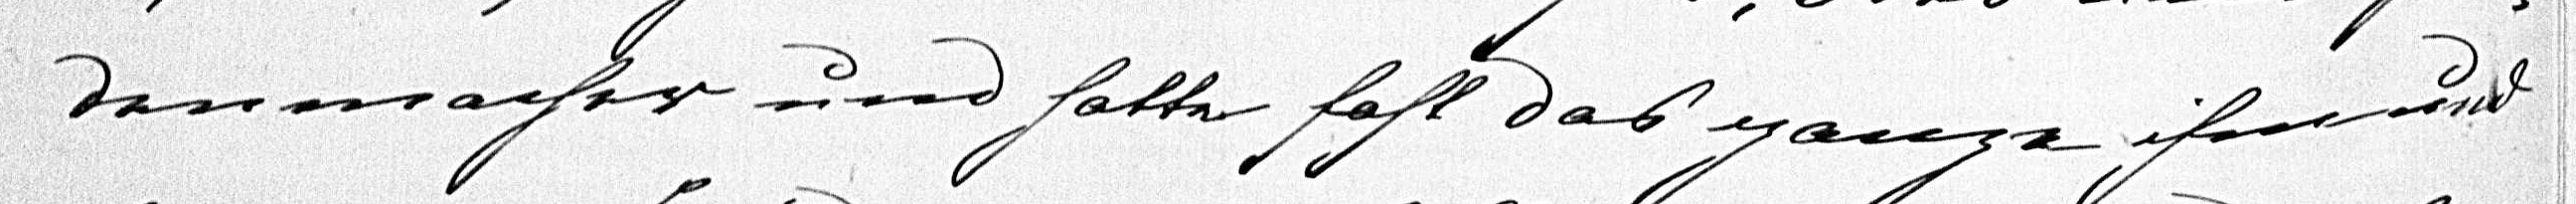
denmacher und hatte fast das ganze ihm und
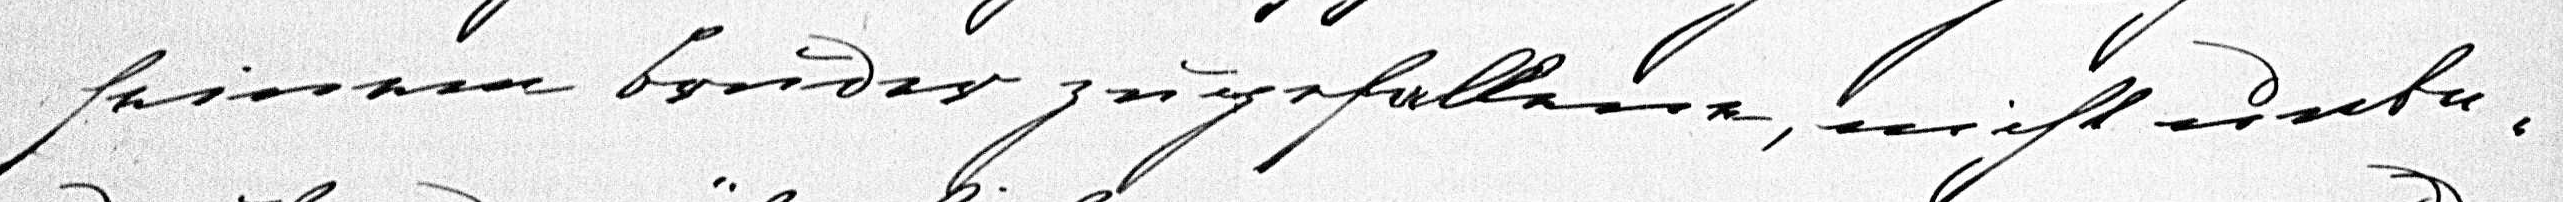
seinem Bruder zugefallene, nicht unbe¬
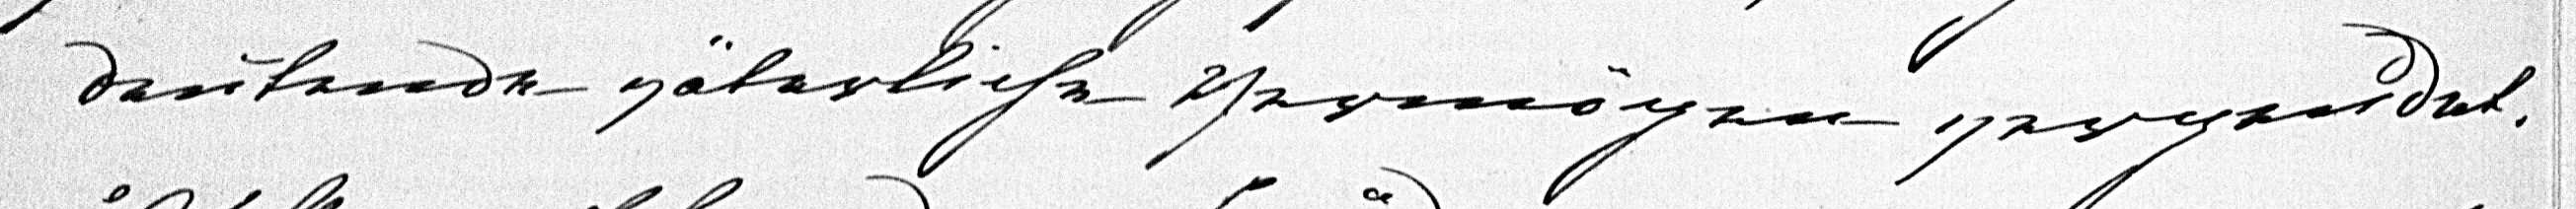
deutende väterliche Vermögen vergeudet.
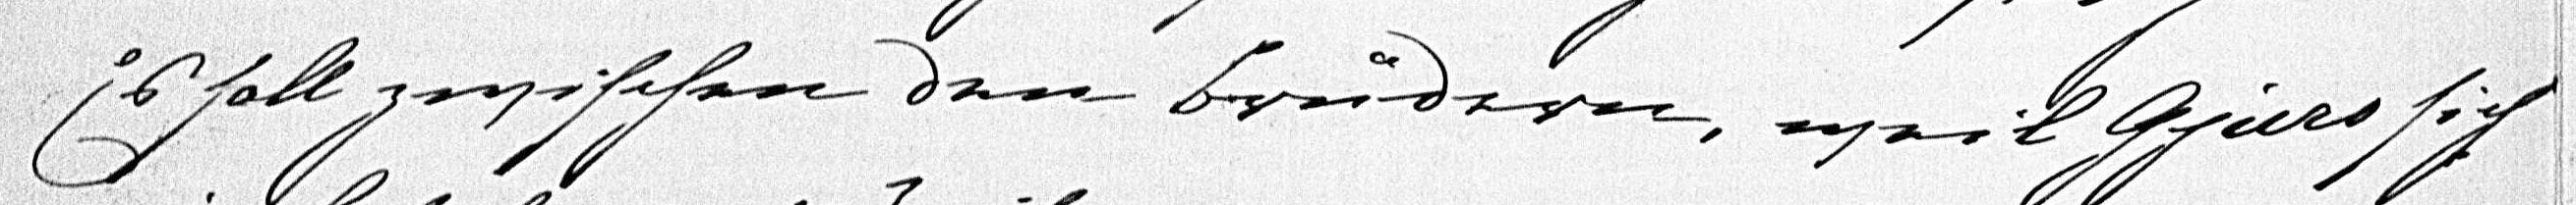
Es soll zwischen den Brudern, weil Gjuro sich
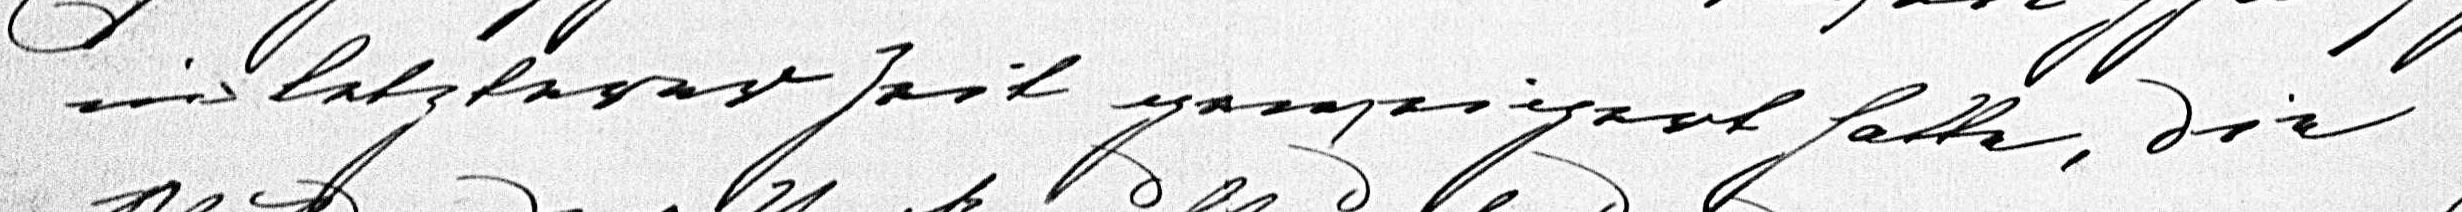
in letzterer Zeit geweigert hatte, die
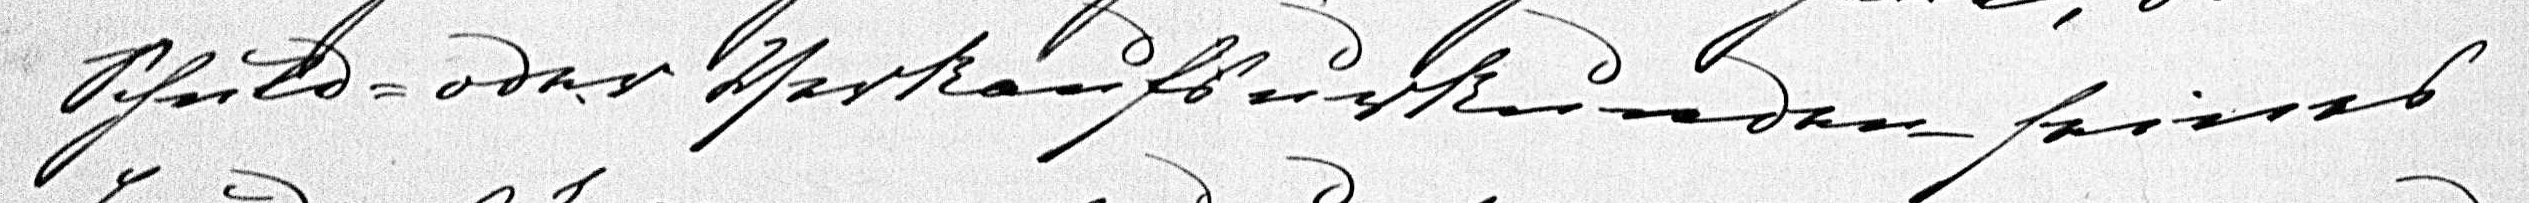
Schuld- oder Verkaufsurkunden seines
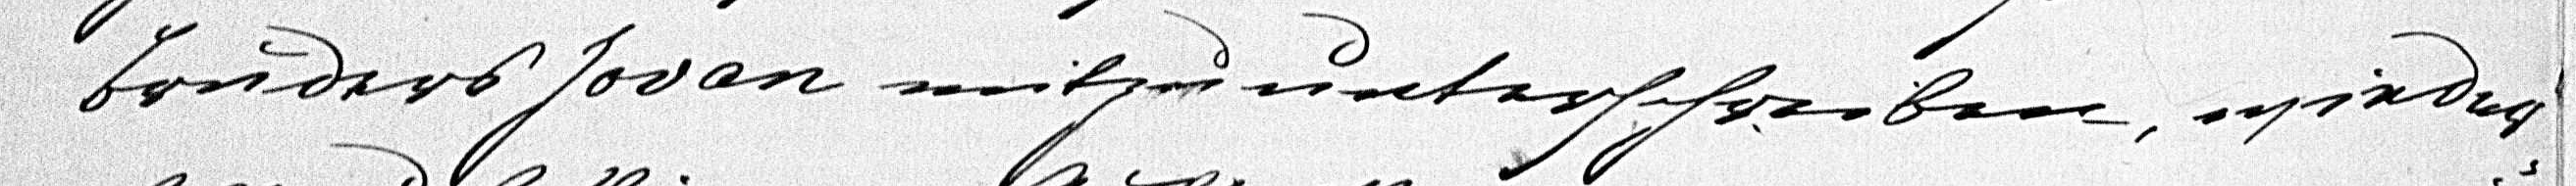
Bruders Jovan mit zu unterschreiben, wieder¬
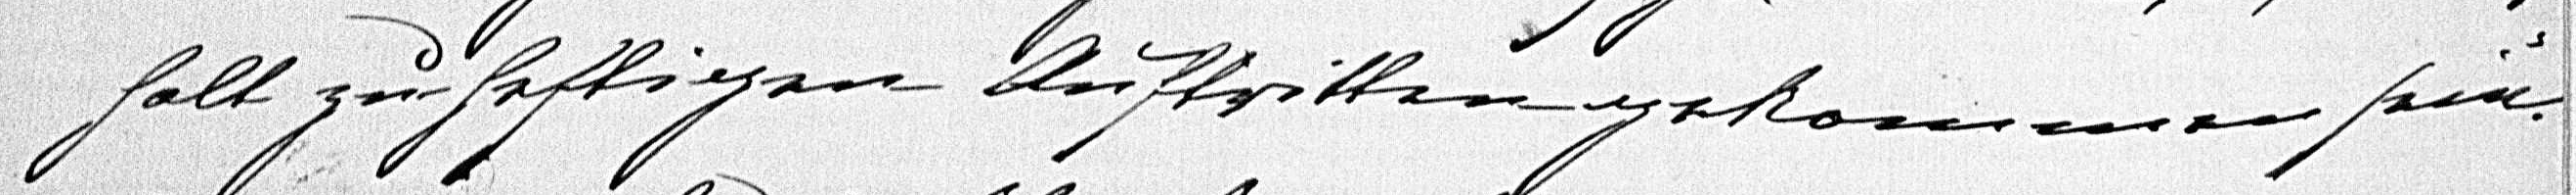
holt zu heftigen Auftritten gekommen sein.
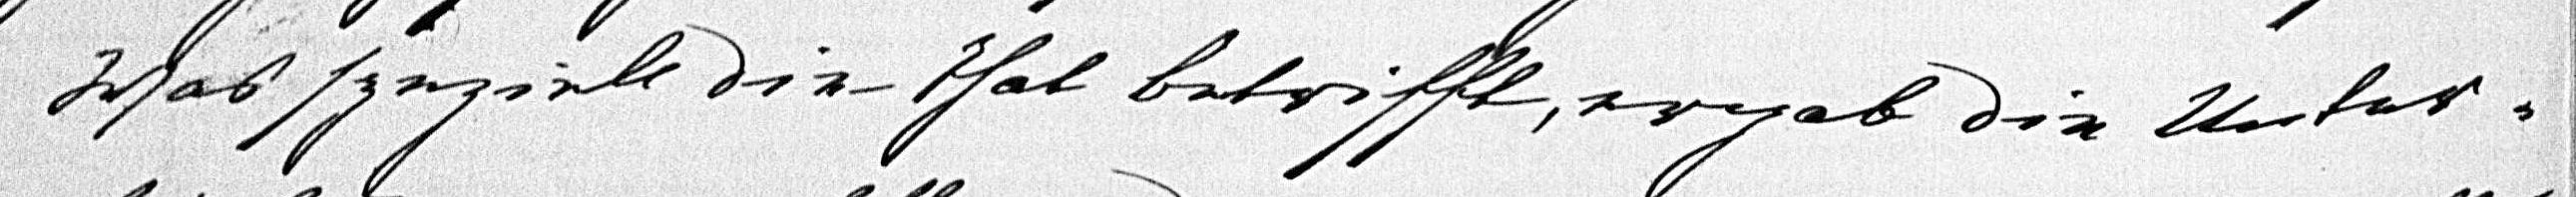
Was speziell die That betrifft, ergab die Unter¬
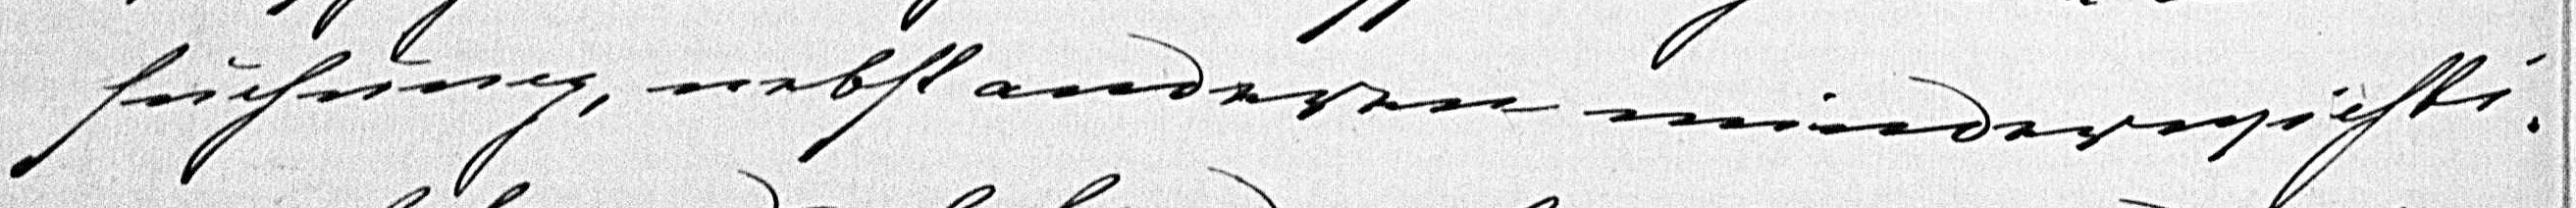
suchung, nebst anderen minderwichti¬
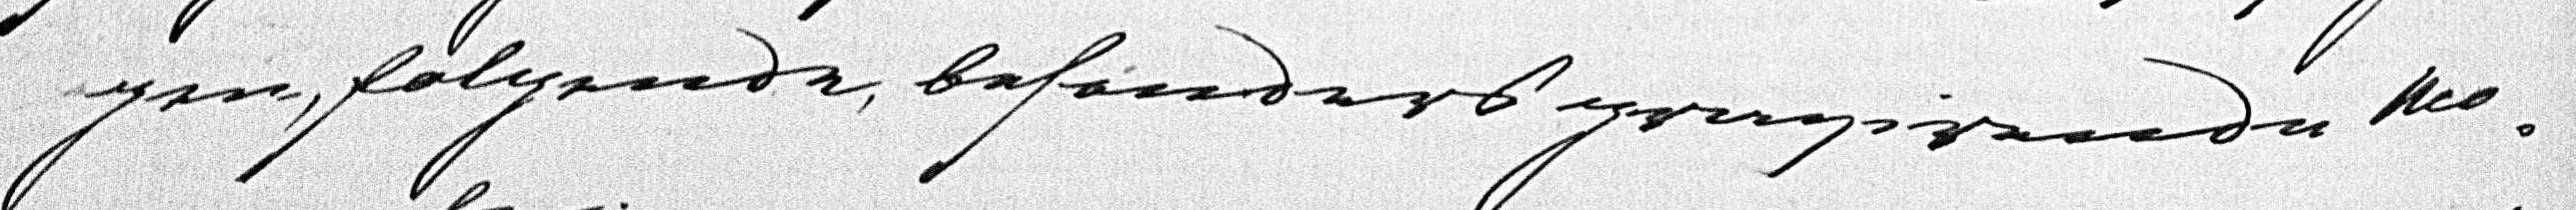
gen, folgende, besonders gravirende Mo¬
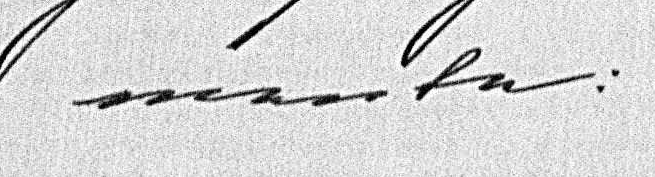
mente:
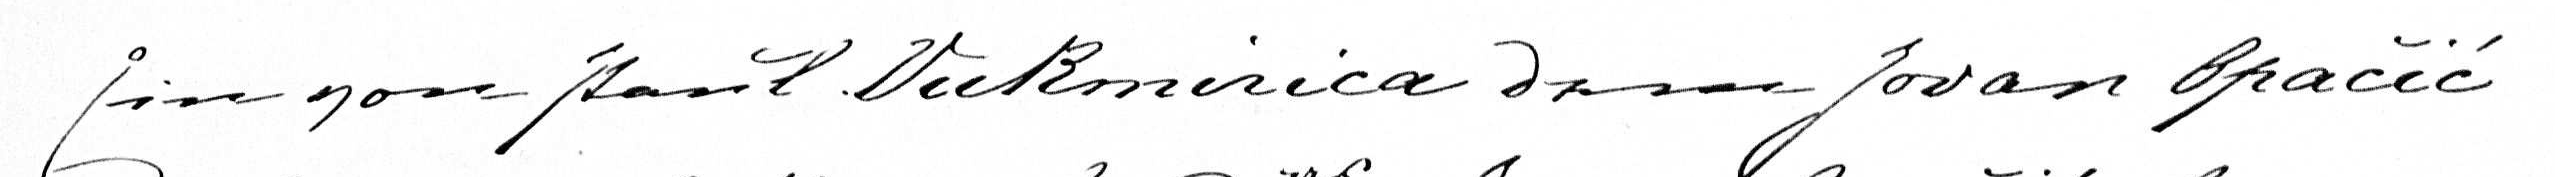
Ein von Paul Vukmirica dem Jovan Opačić
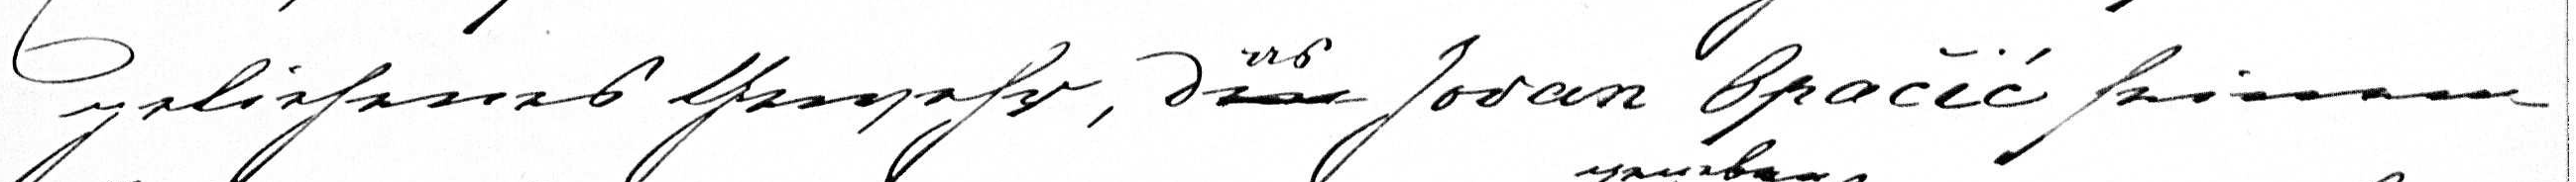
geliehenes Gewehr, des Jovan Opačić seinen
